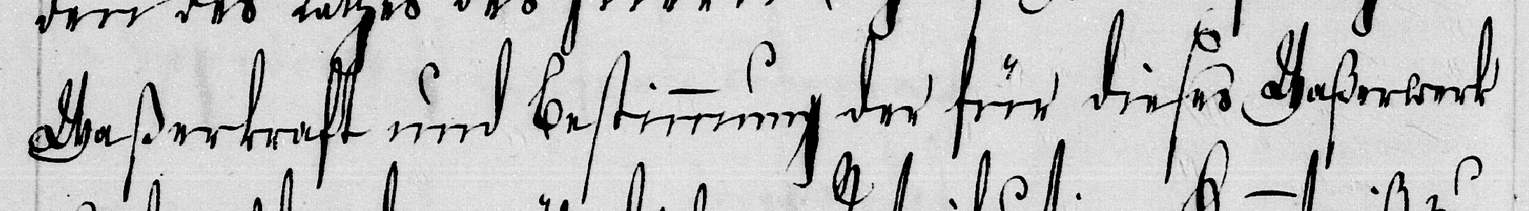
Waßerkraft und Bestimmung der für dieses Waßerwerk
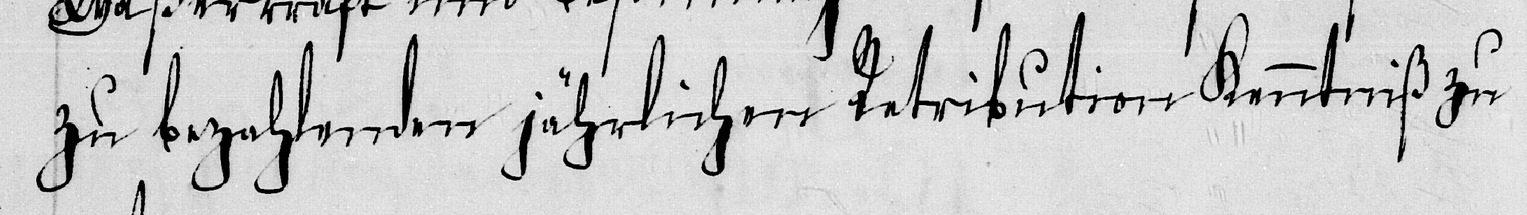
zu bezahlenden jährlichen Retribution Kenntniß zu
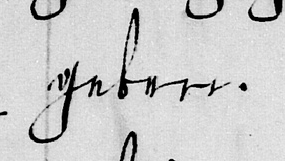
geben.
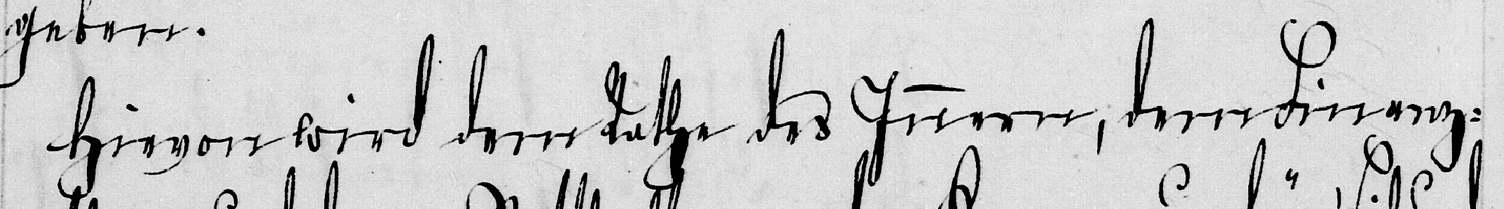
Hievon wird dem Rath des Innern, dem Finanz¬
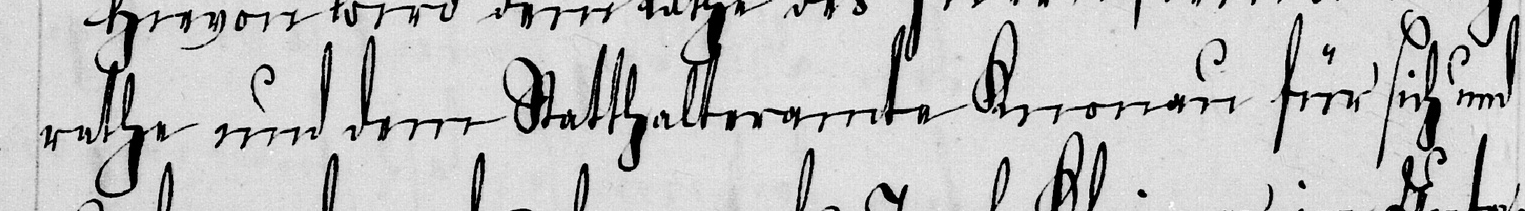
rathe und dem Statthalteramte Knonau für sich
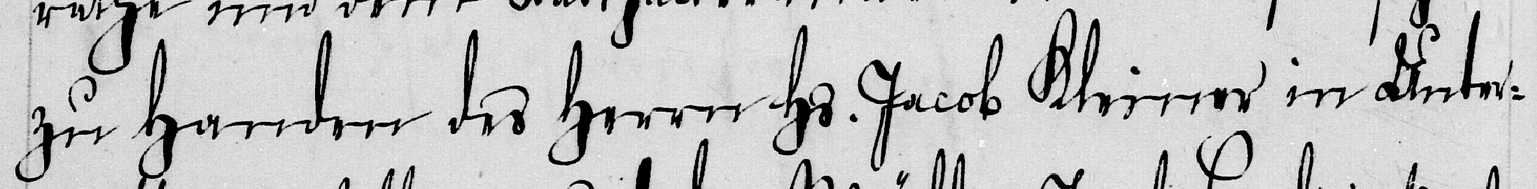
zu Handen des Herrn Hs. Jacob Kleiner in Unte¬
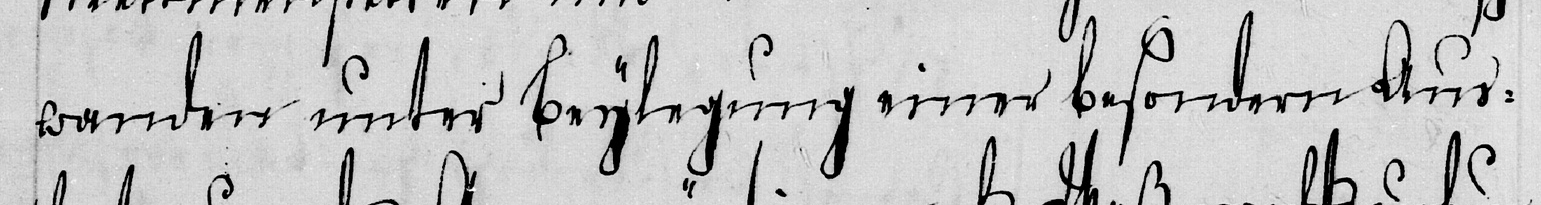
wanden unter Beylegung einer besondern Aus¬
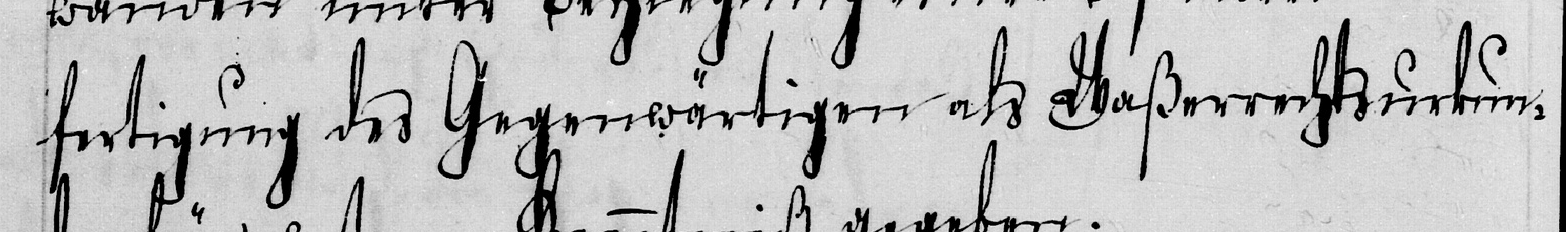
fertigung des Gegenwärtigen als Waßerrechtsurkun¬
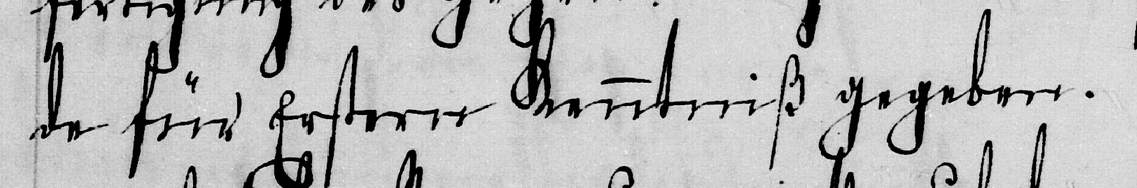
de für Erstern Kenntniß gegeben.
